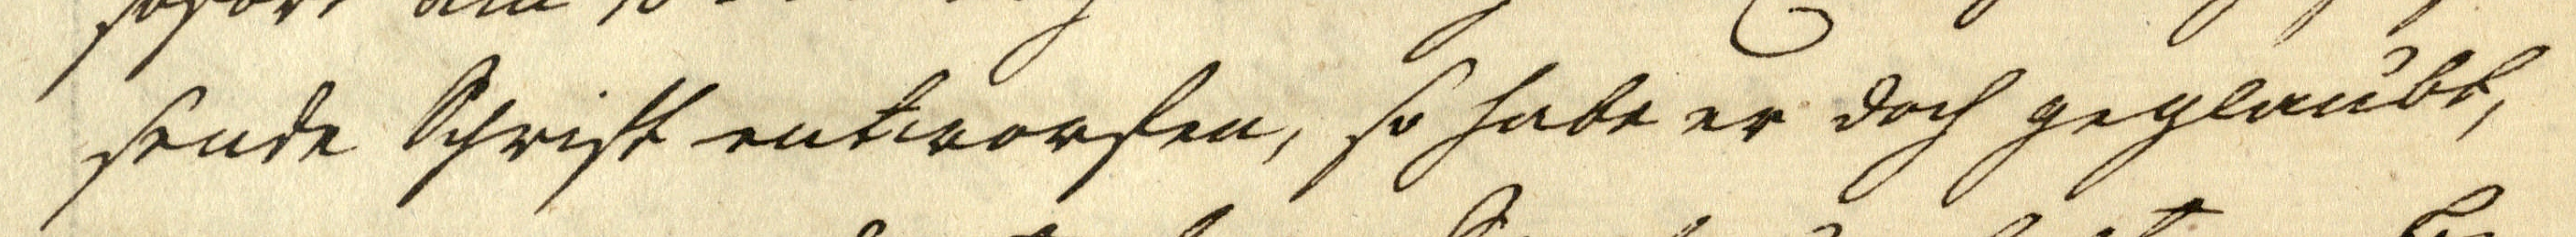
sende Schrift entworfen, so habe er doch geglaubt,
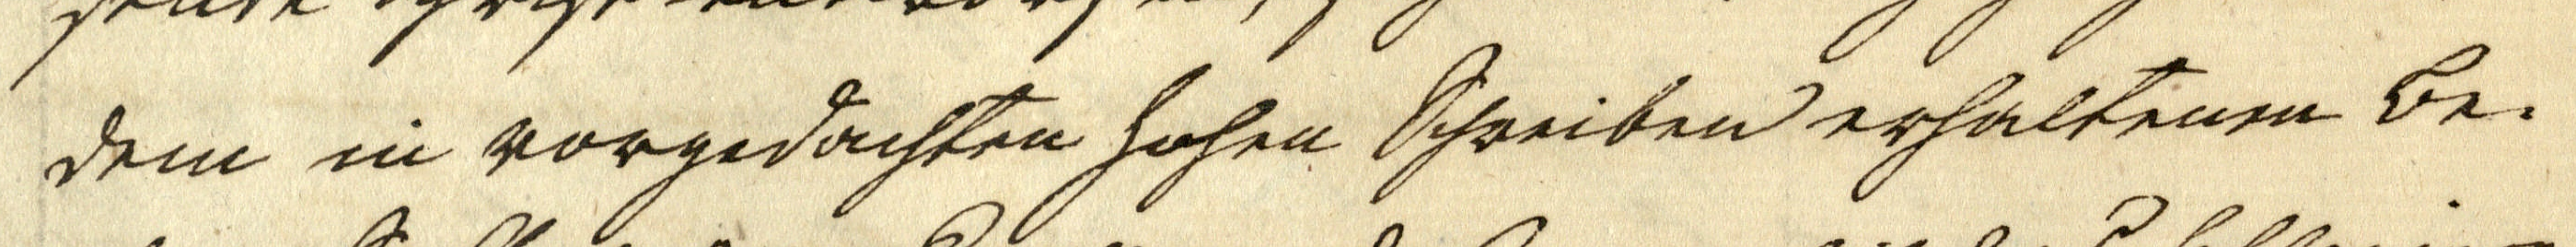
dem in vorgedachten hohen Schreiben erhaltenen Be-
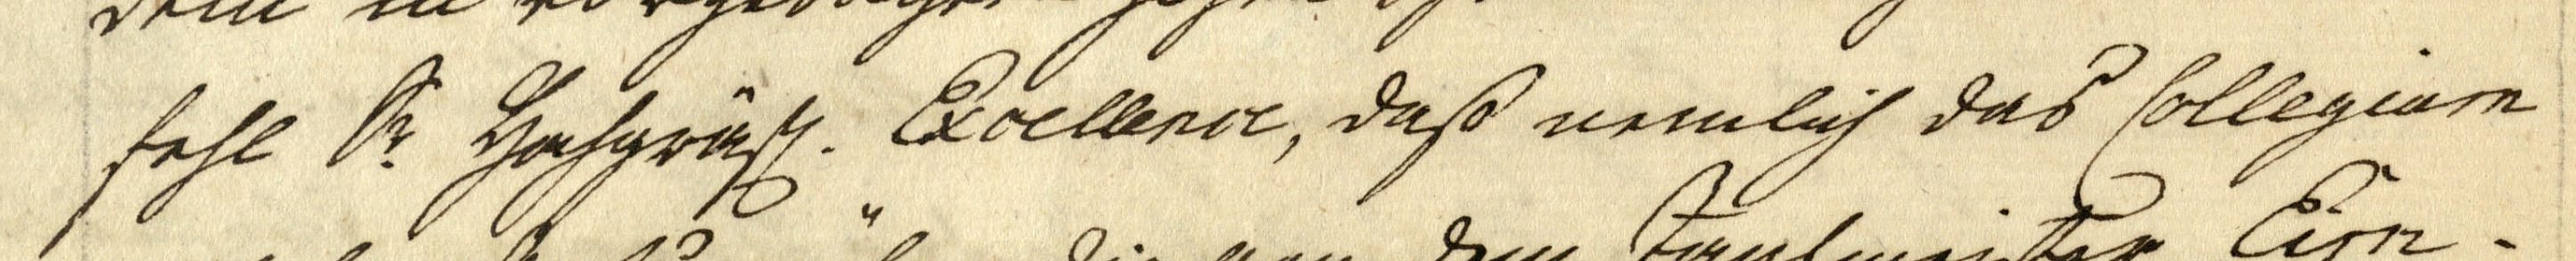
fehl Sr. Hochgräfl. Excellence, daß nemlich das Collegium
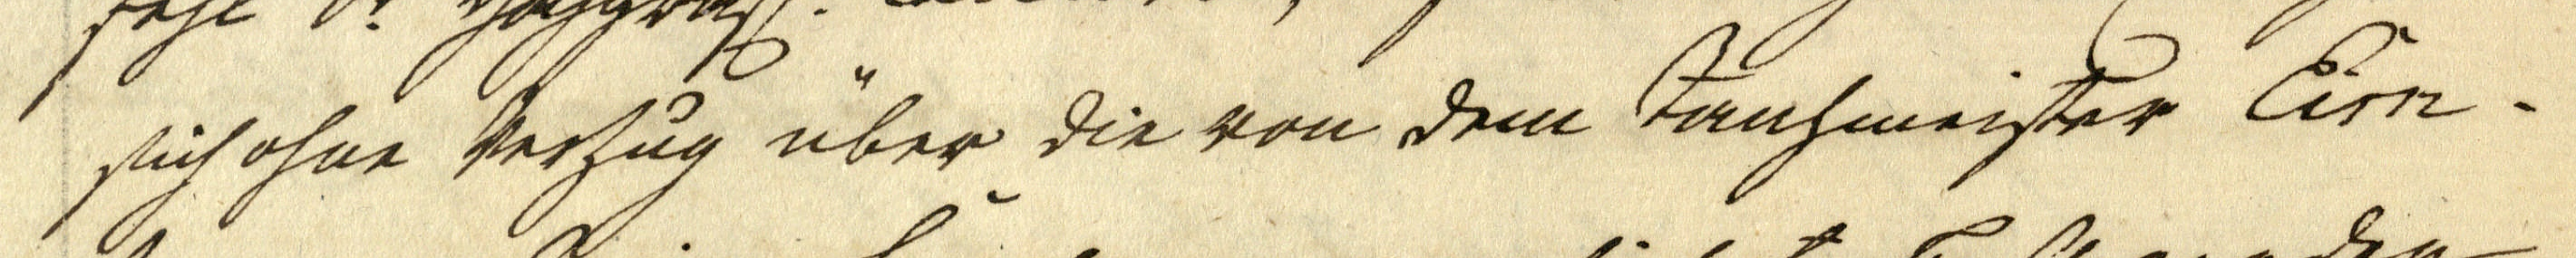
sich ohne Verzug über die von dem Tanzmeister Eim-
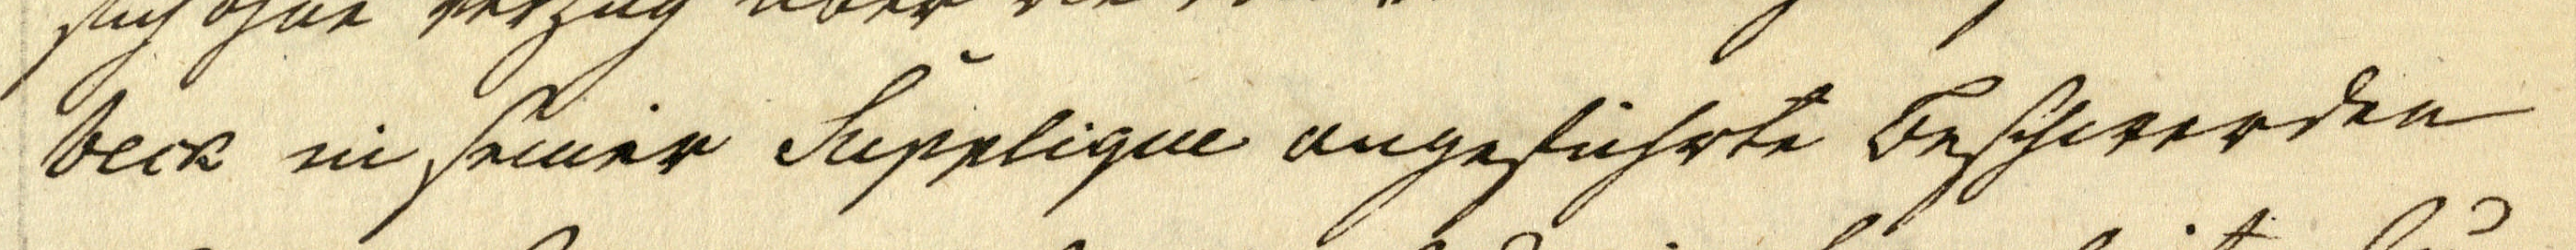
beck in seiner Supplique angeführte Beschwerden
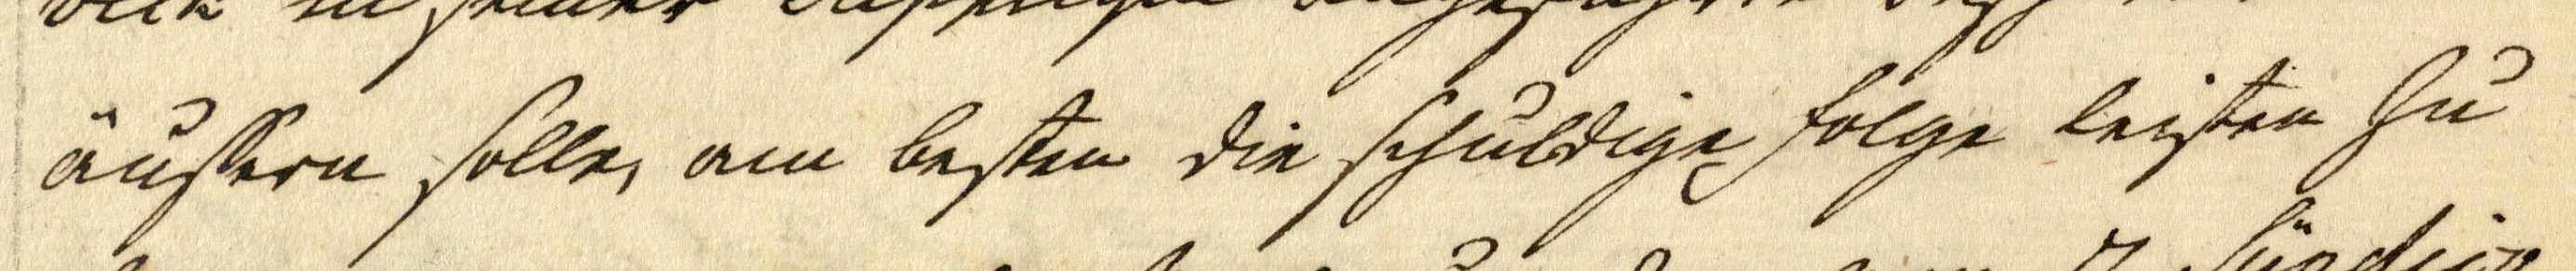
äussern solle, am besten die schuldige Folge leisten zu
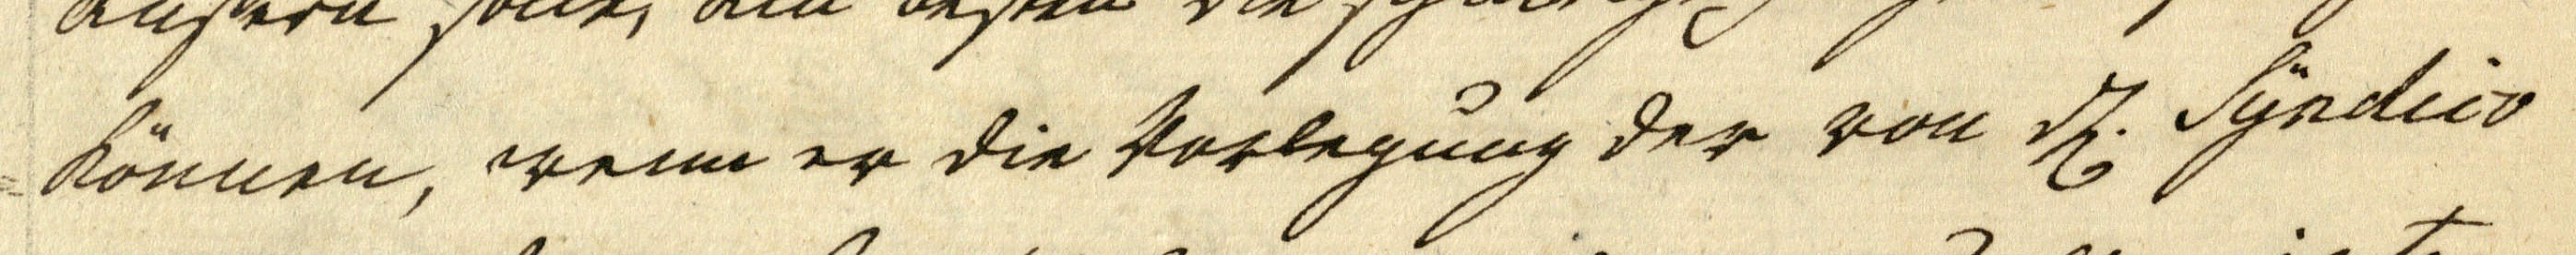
können, wenn er die Vorlegung der von dh. Syndico
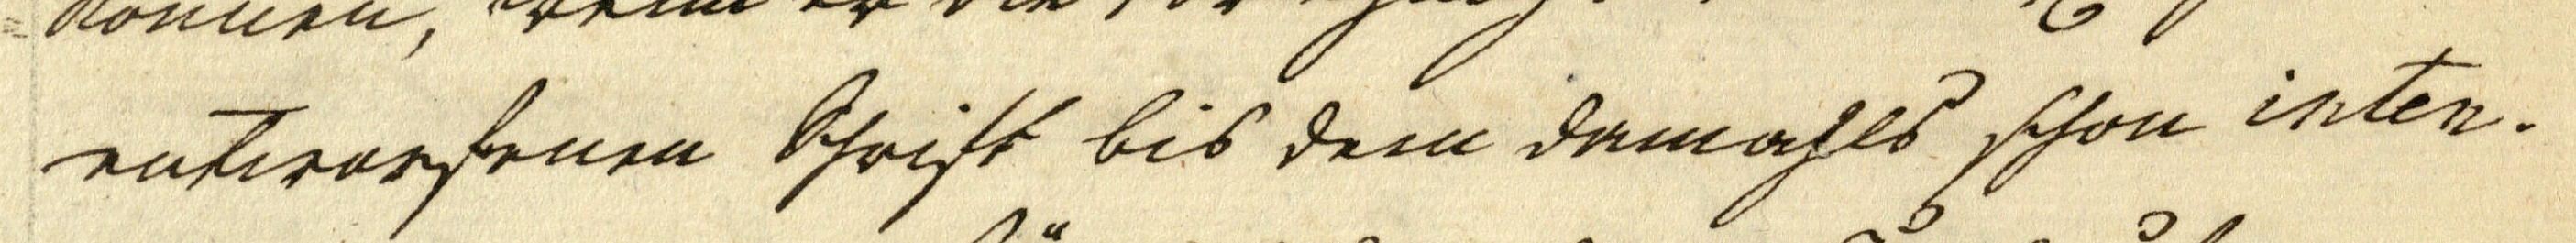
entworfenen Schrift bis dem damahls schon inten-
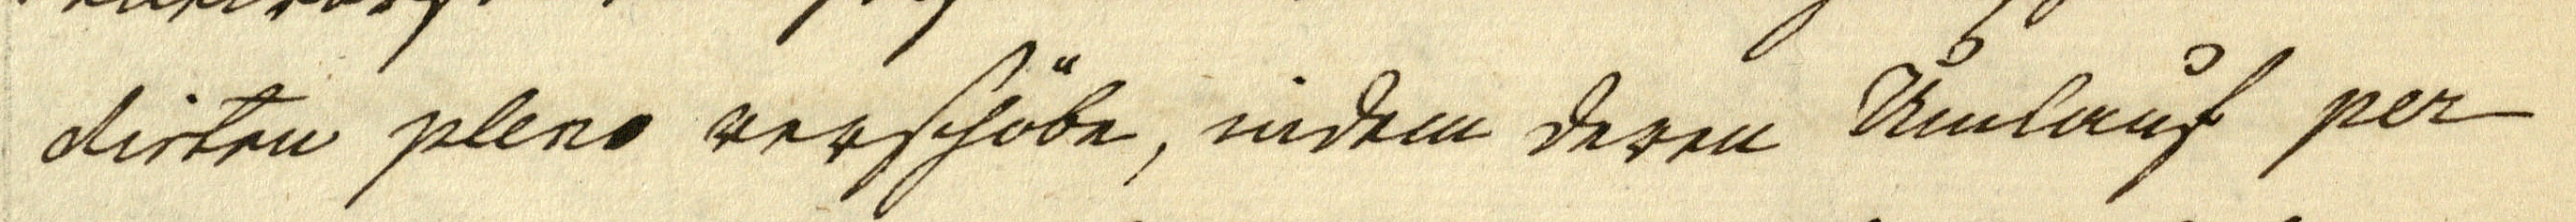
dirten pleno verschöbe, indem deren Umlauf per
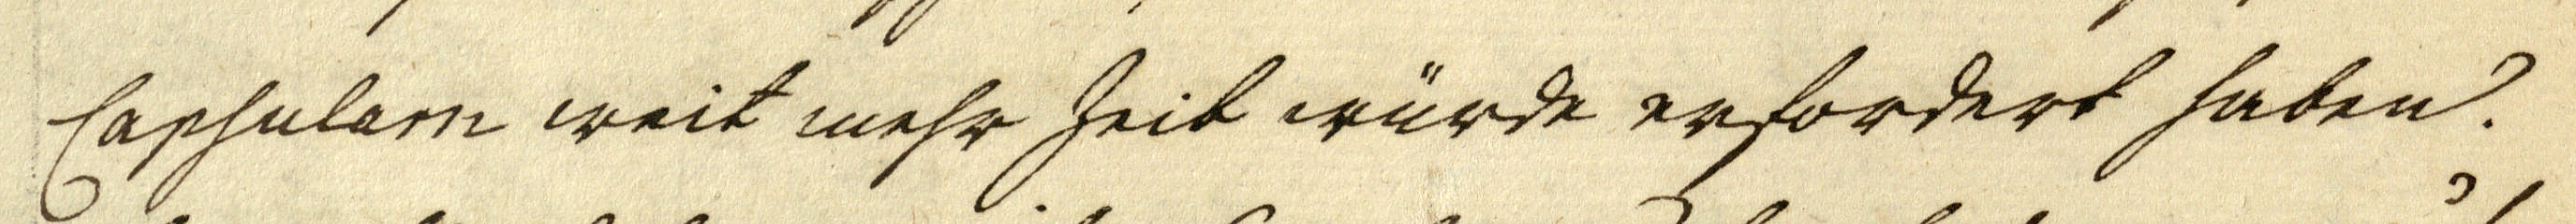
Capsulam weit mehr Zeit würde erfordert haben.
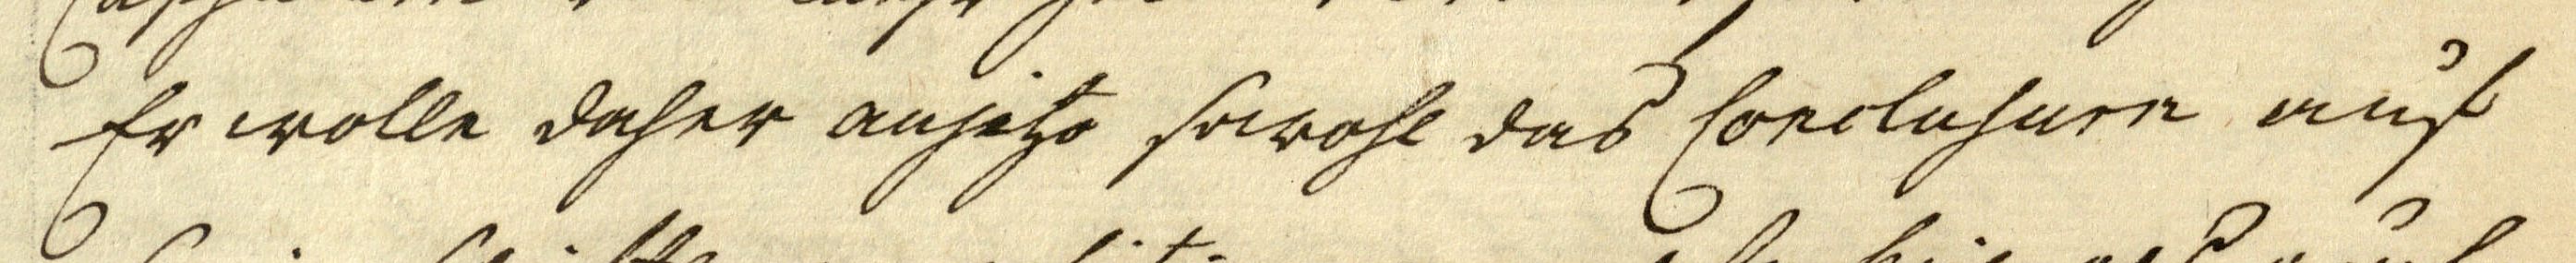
Er wolle daher anjetzo sowohl das Conclusum auf
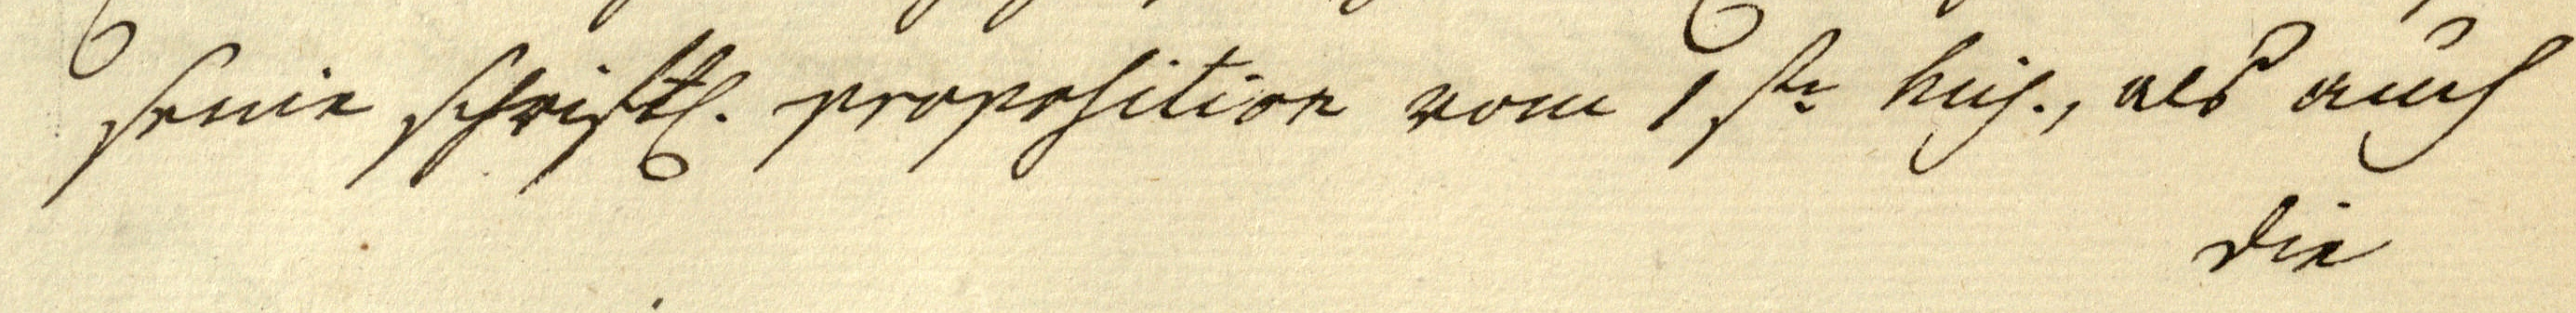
seine schriftl. proposition vom 1sten huj., als auch
